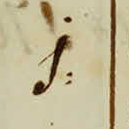1:
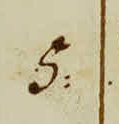5:
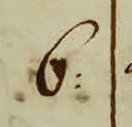6:
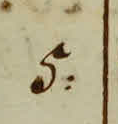5:
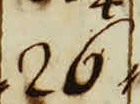26
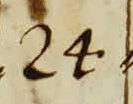24
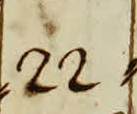22
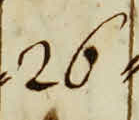26
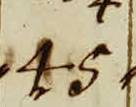45
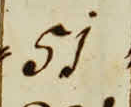51
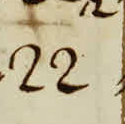22
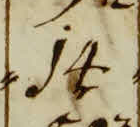14
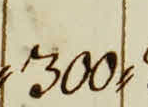300
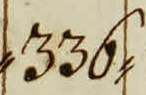336
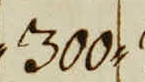300
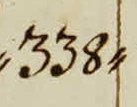338
